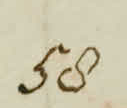58
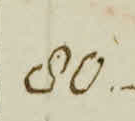80
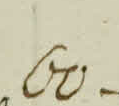60
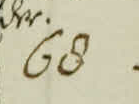68
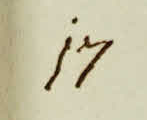17
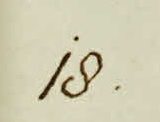18.
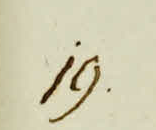19.
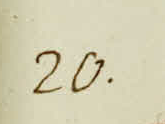20.
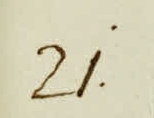21.
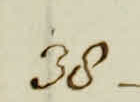38
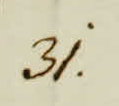31.
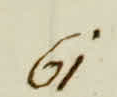61
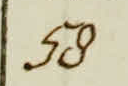58
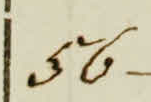56
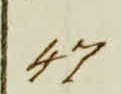47
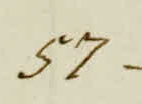57
